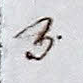3
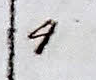4
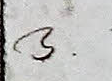3.
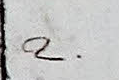2.
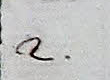2.
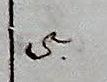5.
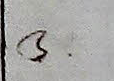3.
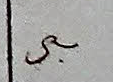5.
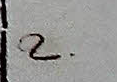2.
